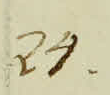24
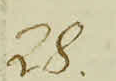28
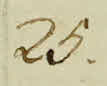25
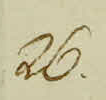26
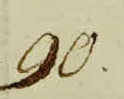90
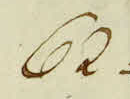62
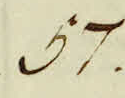57
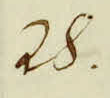28
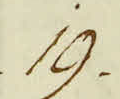19
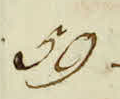59
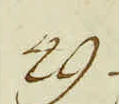49
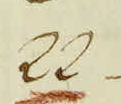22
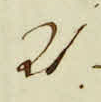21
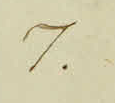7.
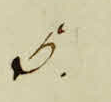5.
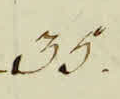35
